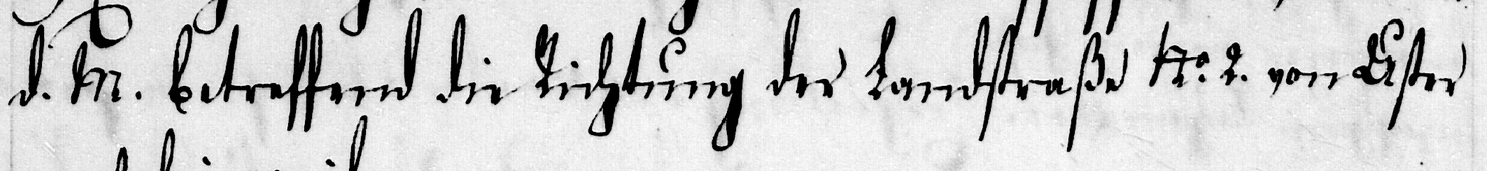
d. M. betreffend die Richtung der Landstraße No. 2. von Uster
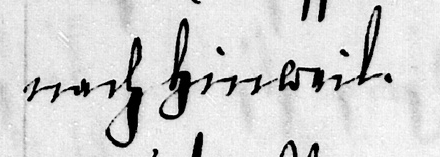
nach Hinweil.
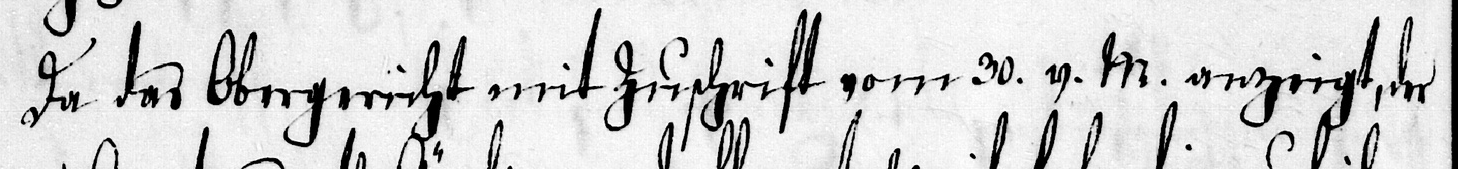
Da das Obergericht mit Zuschrift vom 30. v. M. anzeigt, der
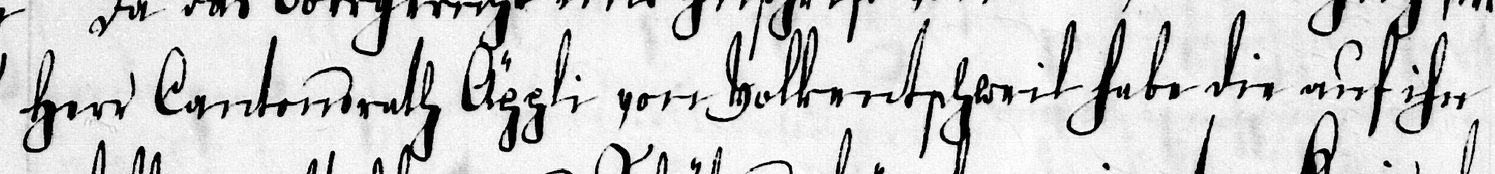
Herr Cantonsrath Äppli von Volkentschweil habe die auf ihn
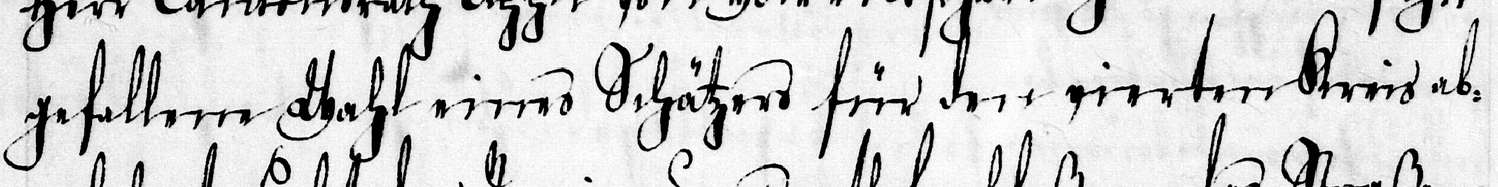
gefallene Wahl eines Schätzers für den vierten Kreis ab¬
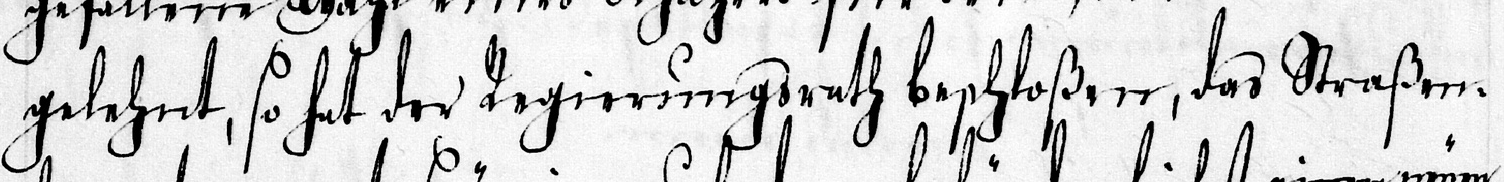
gelehnt, so hat der Regierungsrath beschloßen, das Straßen¬
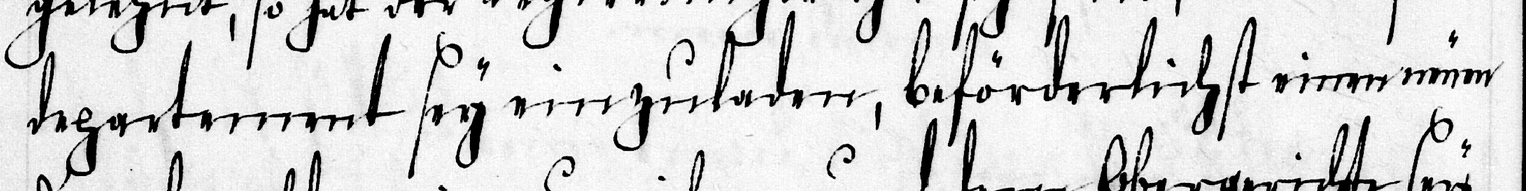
departement sey einzuladen, beförderlichst einen neuen
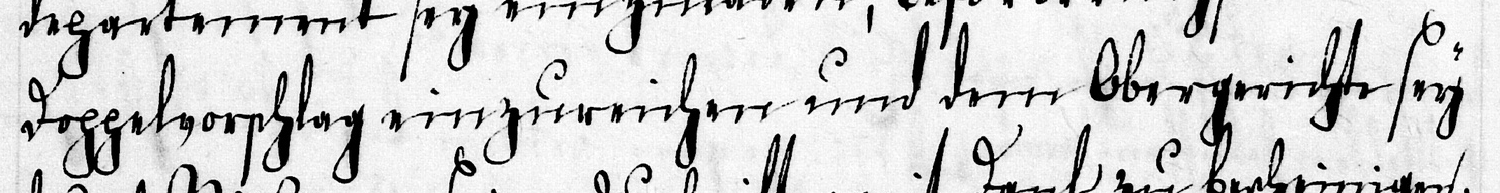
Doppelvorschlag einzureichen und dem Obergerichte sey
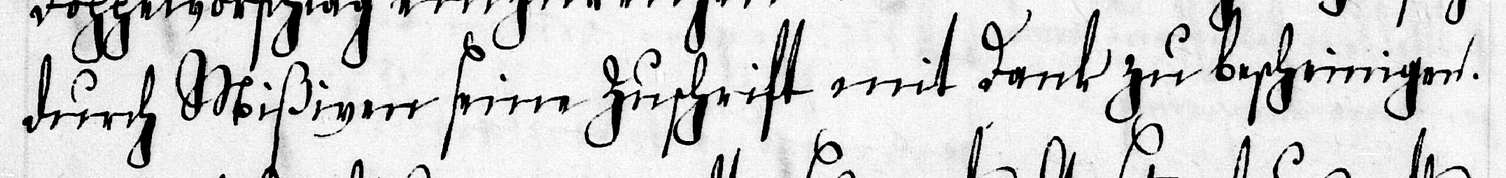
durch Mißiven seine Zuschrift mit Dank zu bescheinigen.
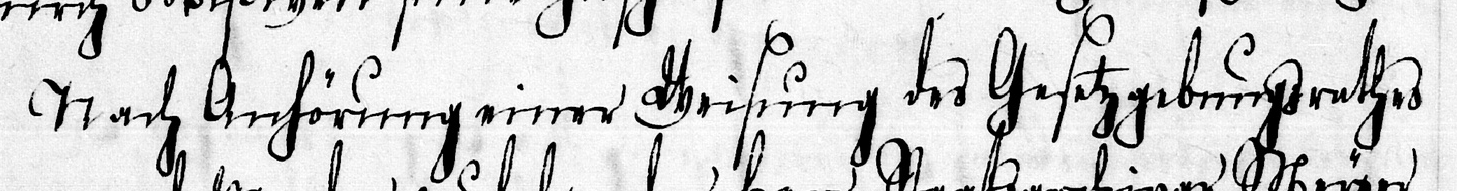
Nach Anhörung einer Weisung des Gesetzgebungsrathes
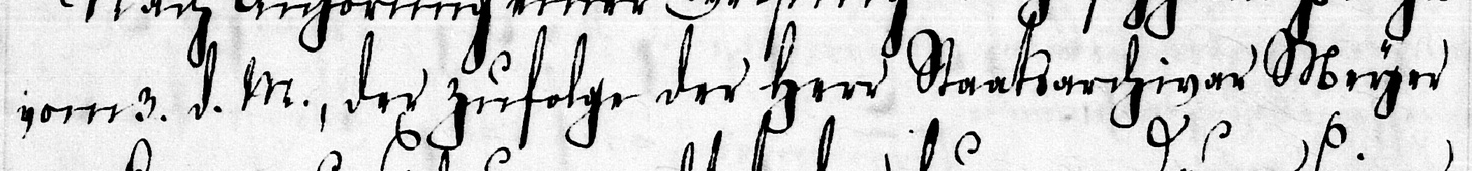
vom 3. d. M., der zufolge der Herr Staatsarchivar Meyer
